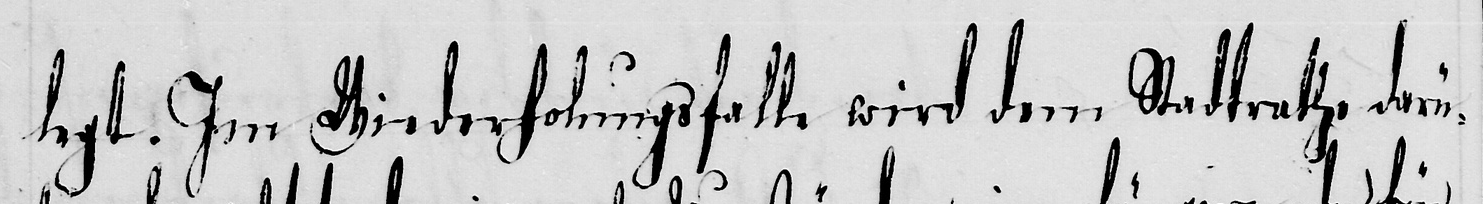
legt. Im Wiederholungsfalle wird dem Stadtrathe dar¬
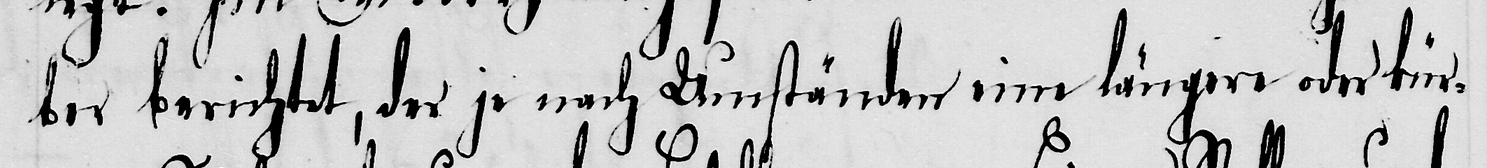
über berichtet, der je nach Umständen eine längere oder kür¬
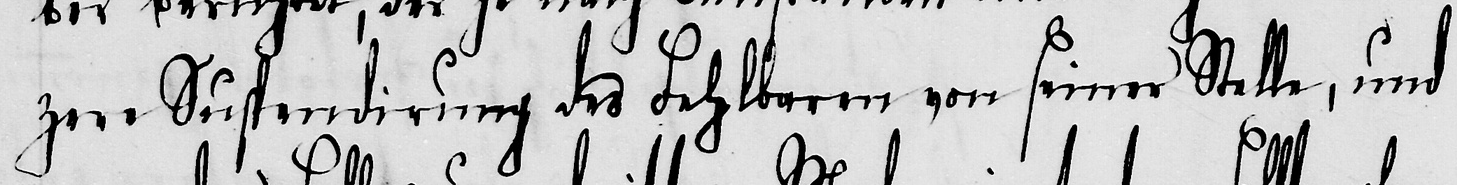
zere Suspendirung des Fehlbaren von seiner Stelle, und
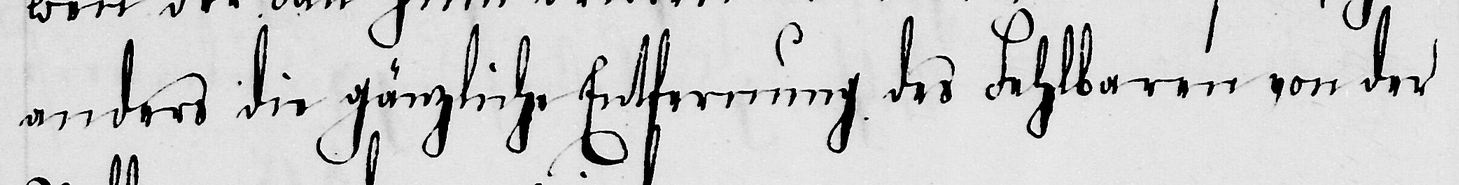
anders die gänzliche Entfernung des Fehlbaren von der
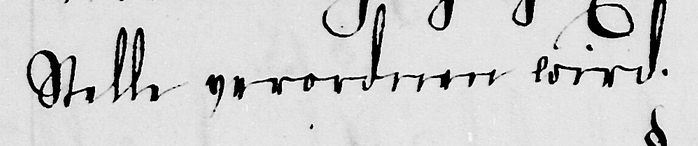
Stelle verordnen wird.
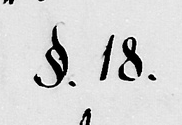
§.18.
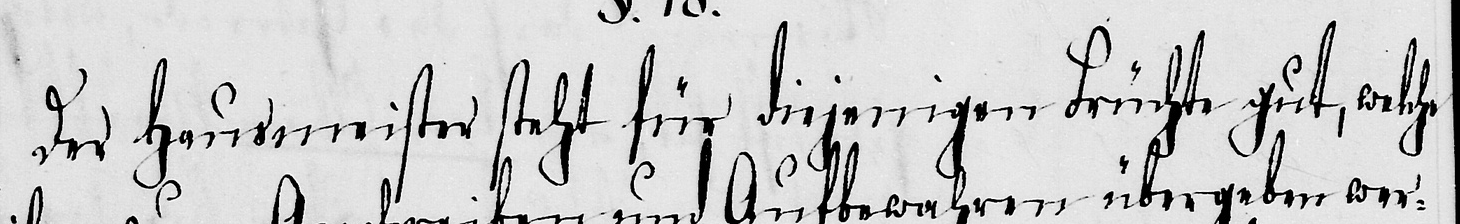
Der Hausmeister steht für diejenigen Früchte gut, welc¬
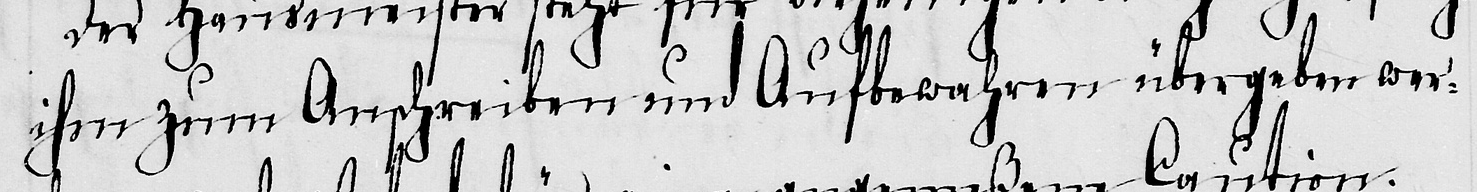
ihm zum Anschreiben und Aufbewahren übergeben wer¬
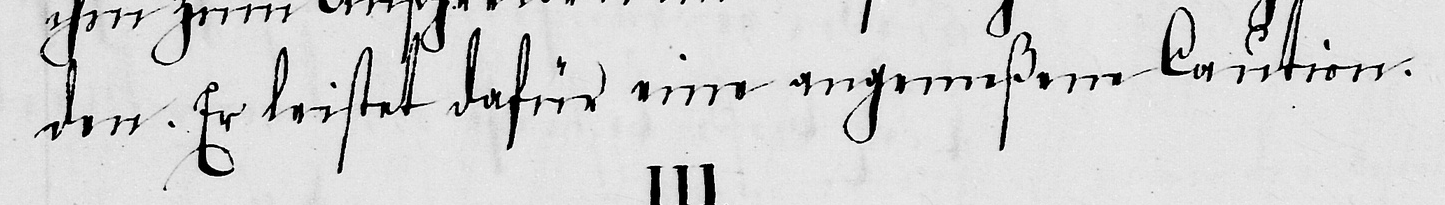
den. Er leistet dafür eine angemeßene Caution.
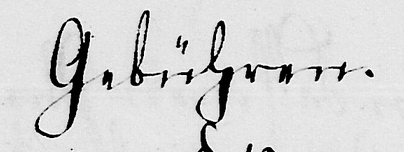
Gebühren
